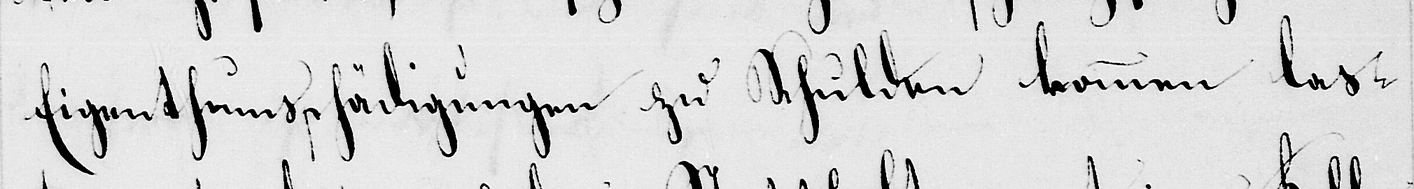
Eigenthumsschädigungen zu Schulden kommen las¬
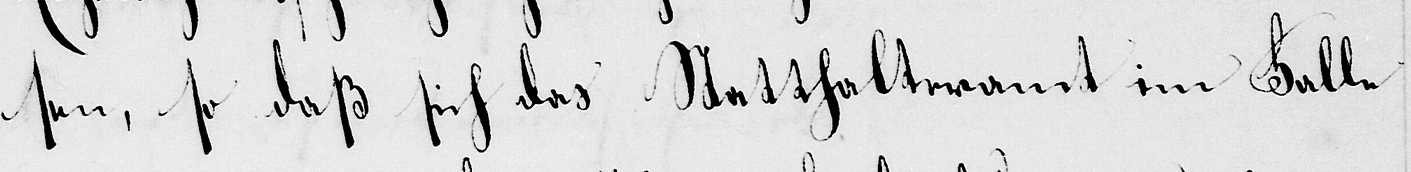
sen, so daß sich das Statthalteramt im Falle
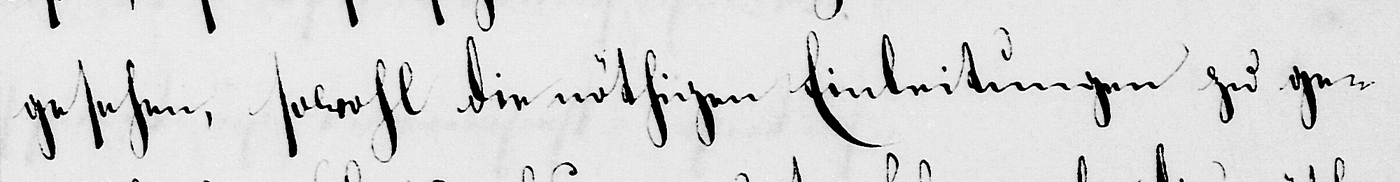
gesehen, sowohl die nöthigen Einleitungen zu ge¬
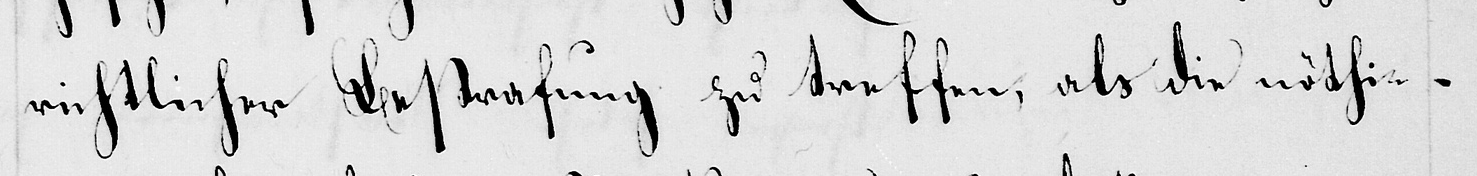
richtlicher Bestrafung zu treffen, als die nöthi¬
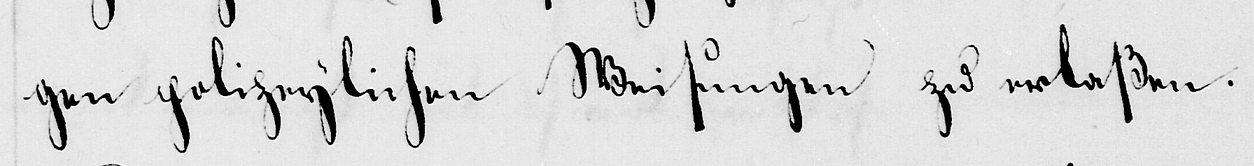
gen polizeylichen Weisungen zu erlaßen.
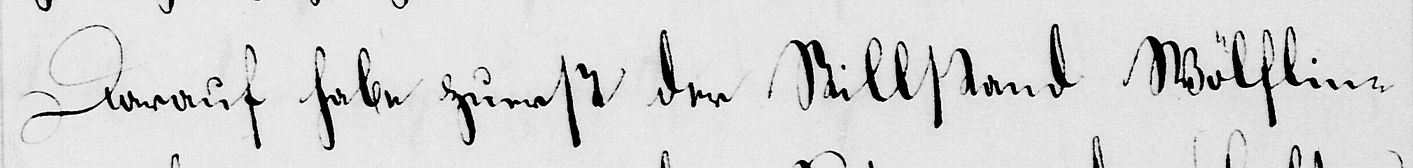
Darauf habe zuerst der Stillstand Wölflin¬
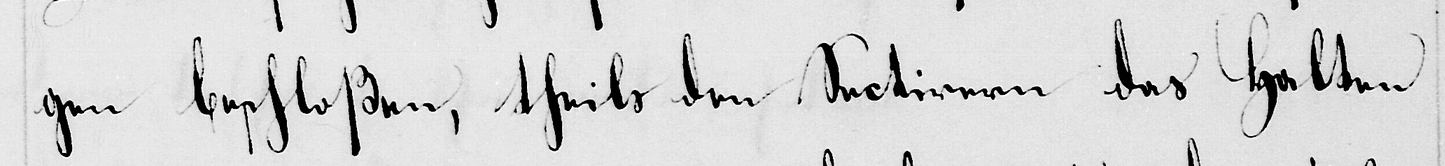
gen beschloßen, theils den Sectirern das Halten
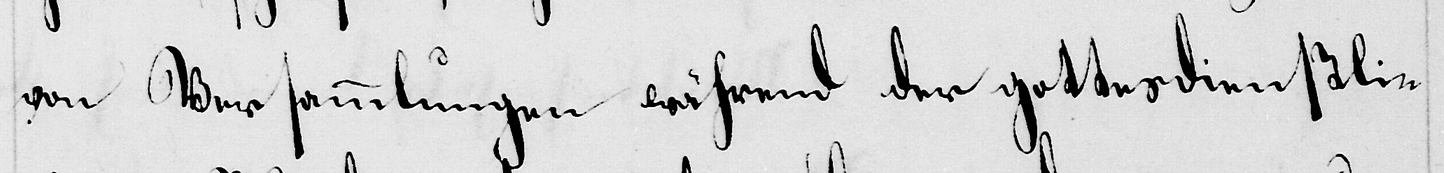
von Versammlungen während der gottesdienstli¬
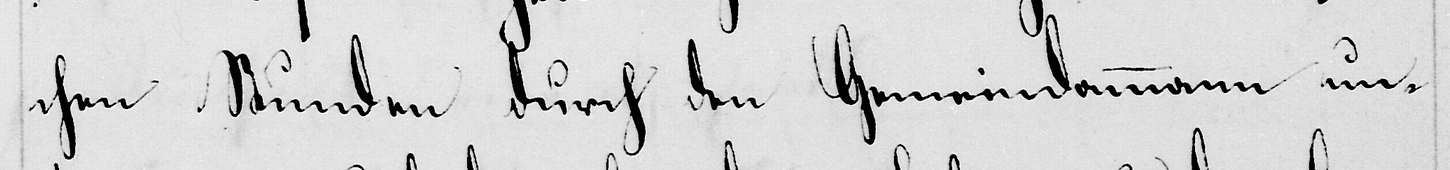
chen Stunden durch den Gemeindammann un¬
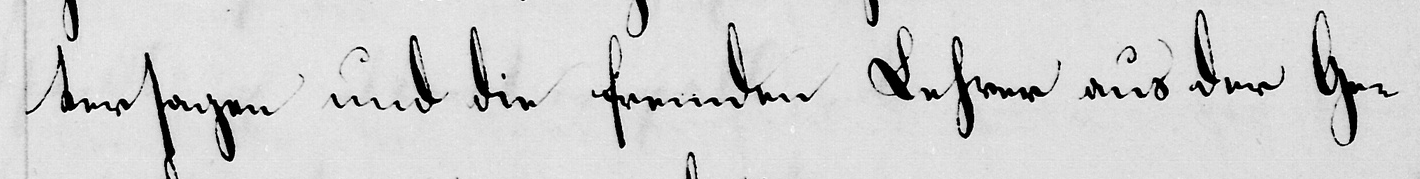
tersagen und die fremden Lehrer aus der Ge¬
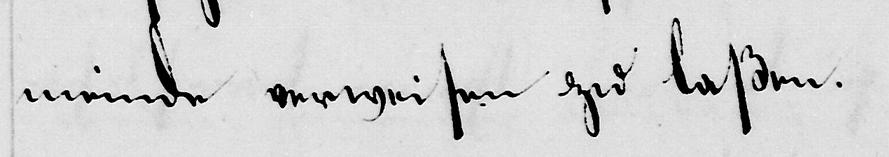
meinde ausweisen zu laßen.
